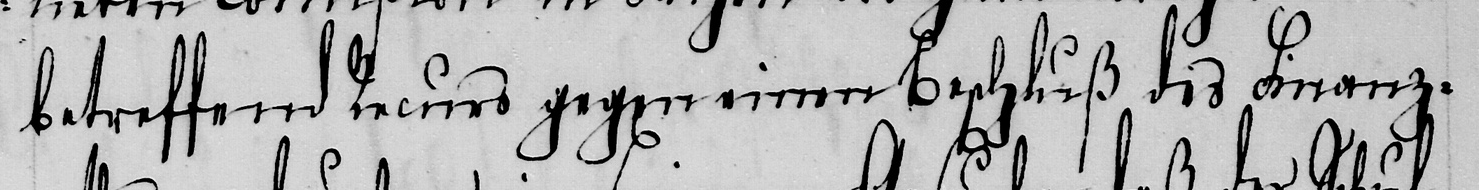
betreffend Recurs gegen einen Beschluß des Finanz¬
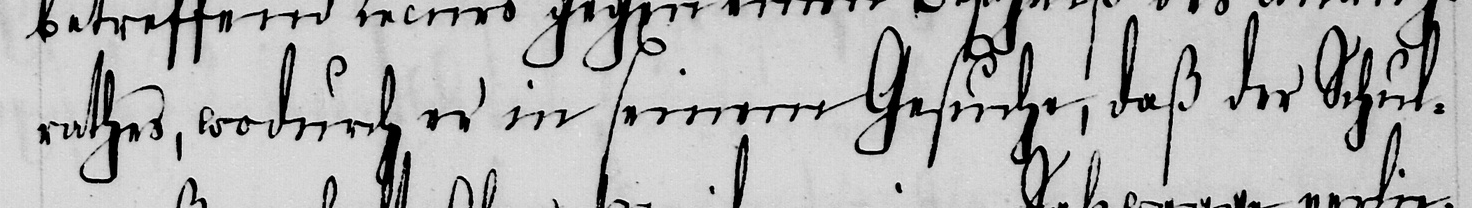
rathes, wodurch er in seinem Gesuche, daß der Schul¬
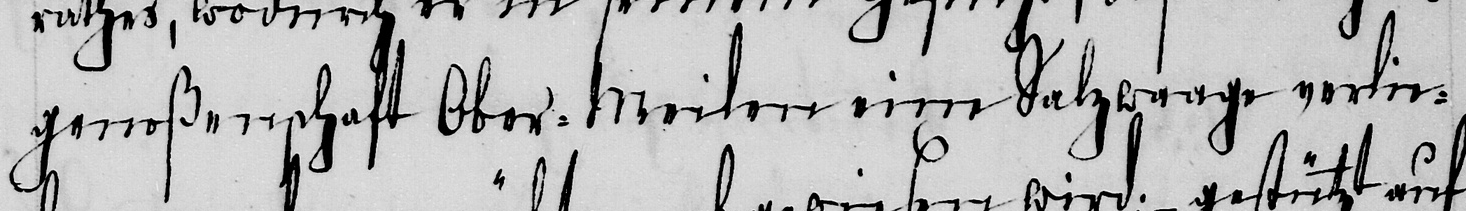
genoßenschaft Ober-Meilen eine Salzwaage verlie¬
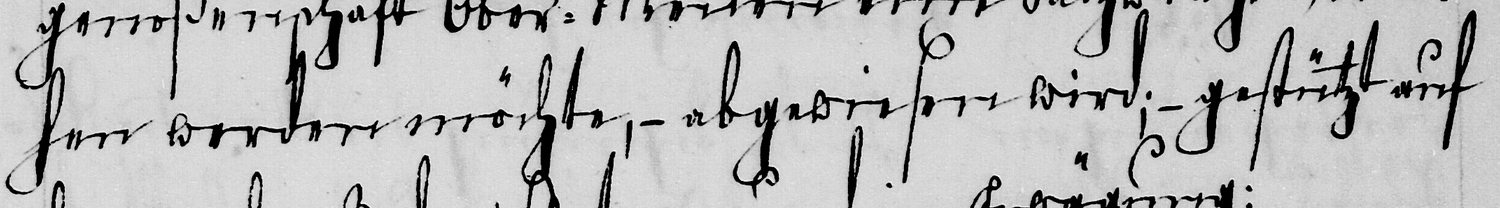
hen werden möchte, – abgewiesen wird; – gestützt auf
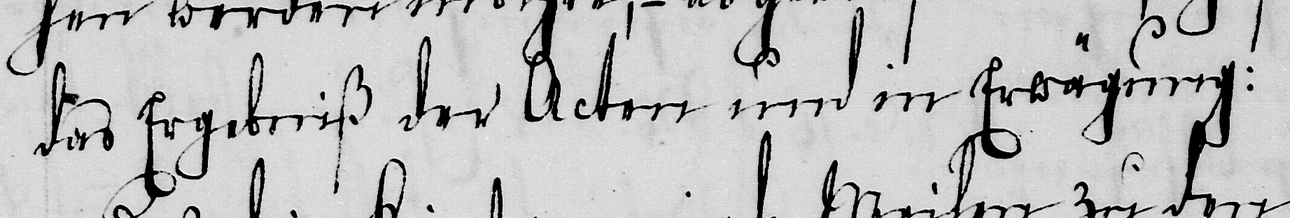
das Ergebniß der Acten und in Erwägung:
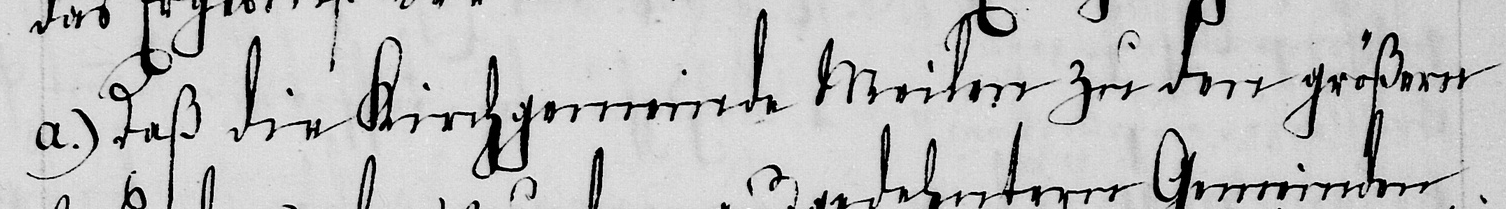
a.) Daß die Kirchgemeinde Meilen zu den größern
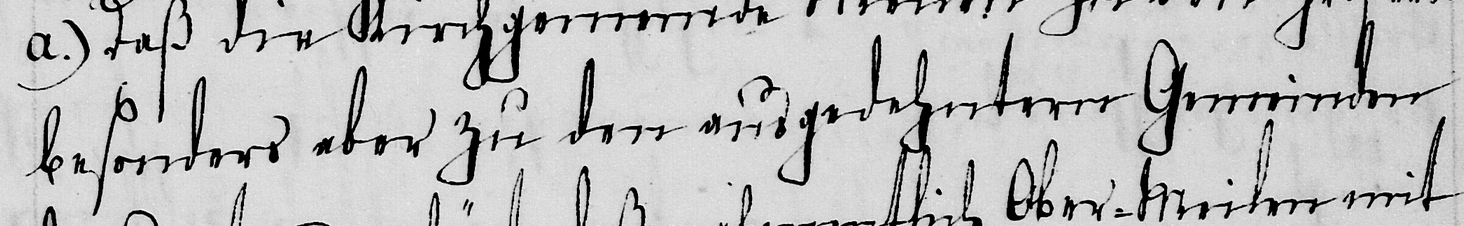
besonders aber zu den ausgedehntern Gemeinden
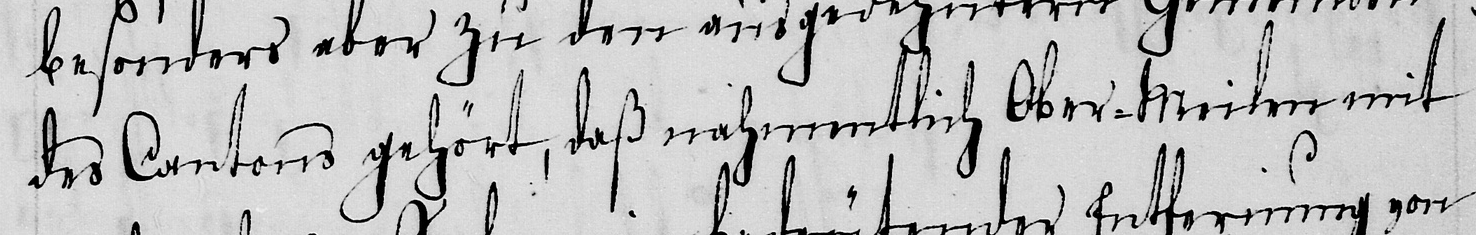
des Cantons gehört, daß nahmentlich Ober-Meilen mit
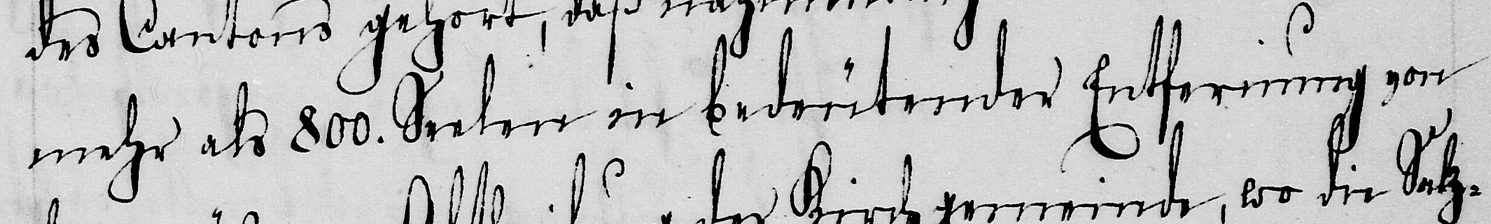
mehr als 800. Seelen in bedeutender Entfernung von
